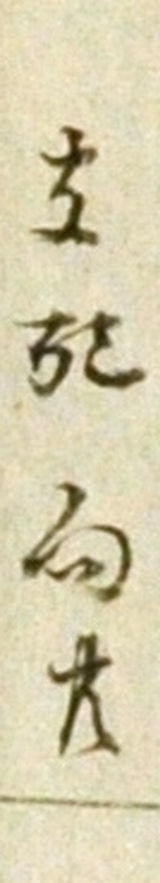支配向共
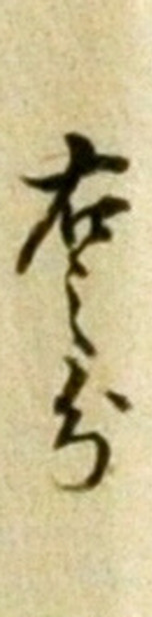右之分
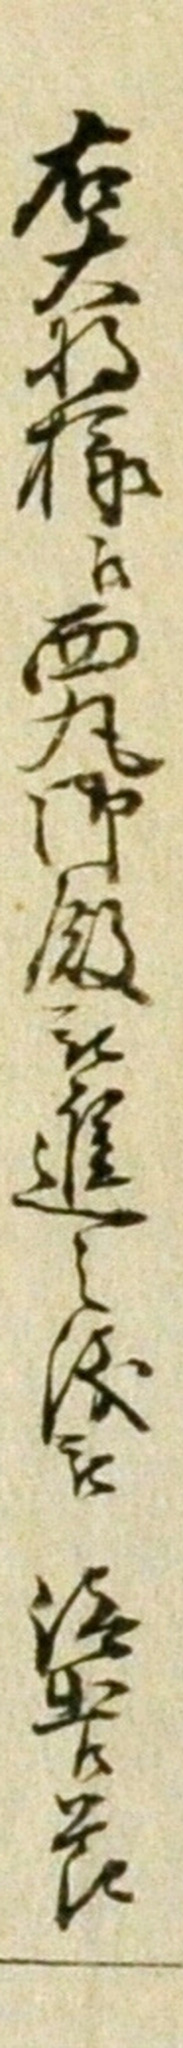右大将様江西丸御殿被進之儀被仰出候節
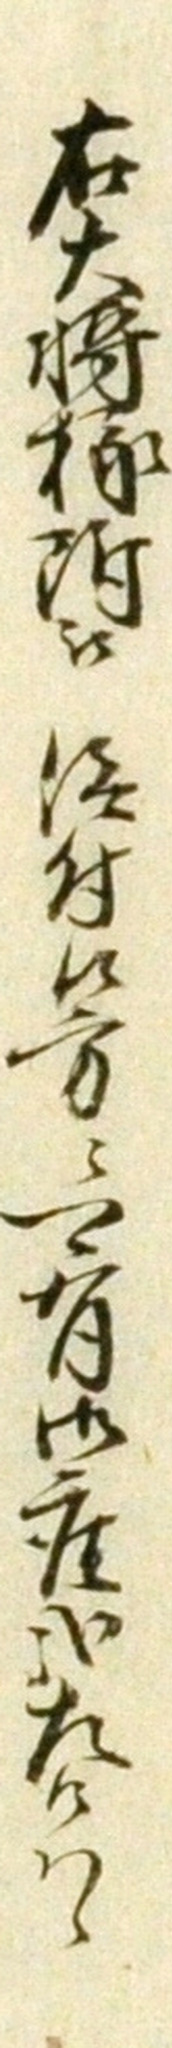右大将様附被仰付候方ニ可有御座哉左候ハゝ
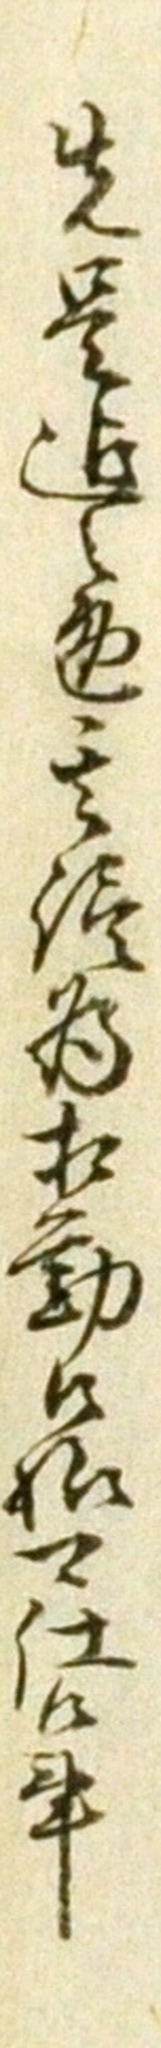先是迄之通其侭為相勤候様可仕候事
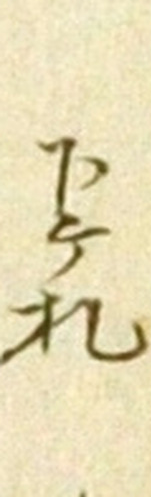下ケ札
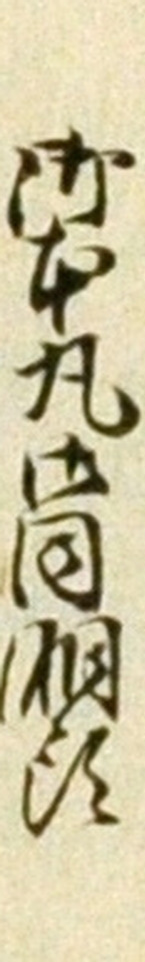御本丸御同朋頭
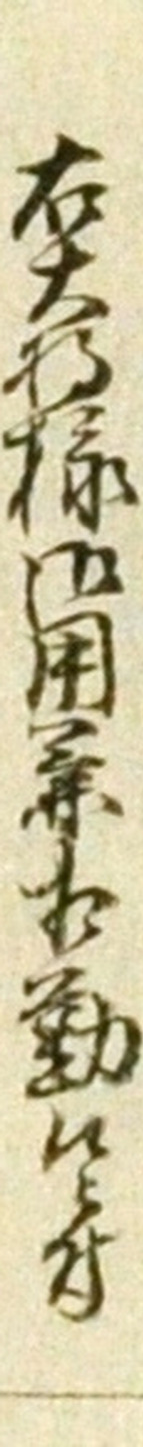右大将様御用兼相勤候ニ付
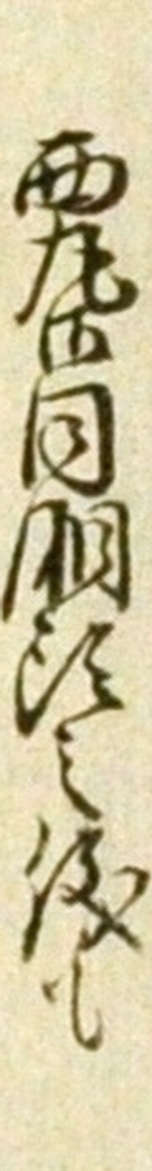西丸御同朋頭之儀も
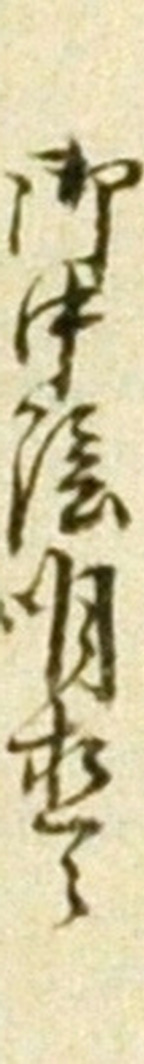御中陰明直ニ
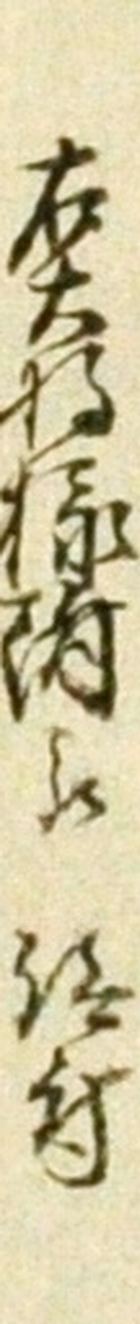右大将様附被仰付
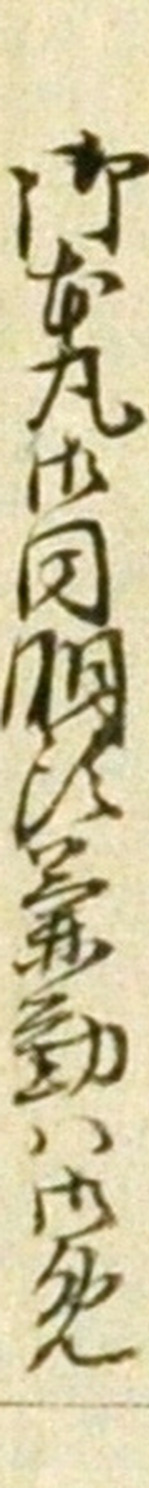御本丸御同朋頭兼勤ハ御免
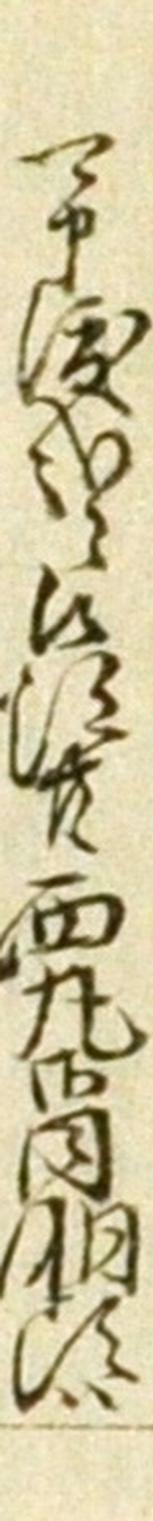可申渡哉ニ候得共西丸御同朋頭ハ
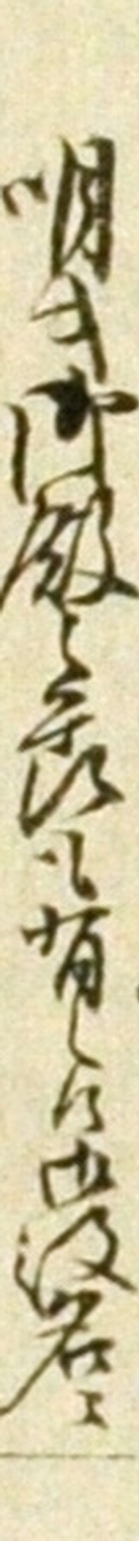明き御殿之節も有之候御役名ニ
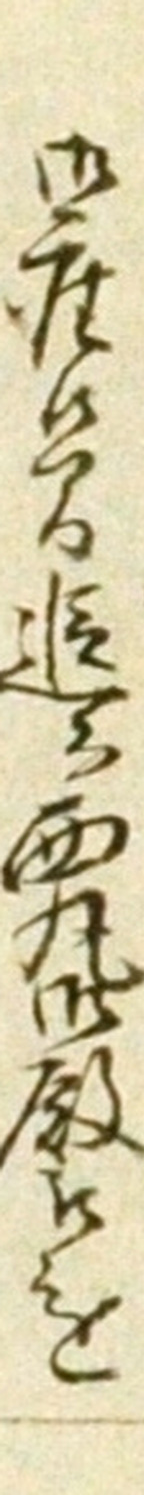御座候間追而西丸御殿江進
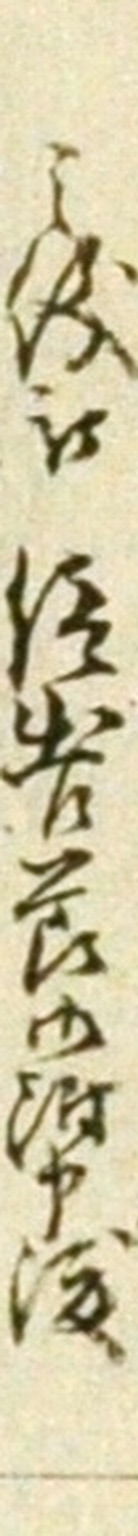之儀被仰出候節御附申渡
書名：若年寄御役中御調書付
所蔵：伊那市立高遠町図書館・合同会社AMANE
